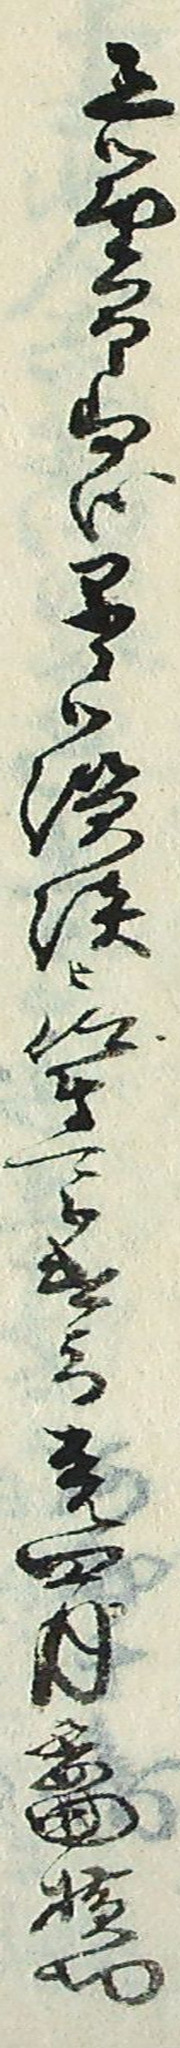有御坐間布哉早々御讃談被仰付可被遣旨去ル四月委細横切
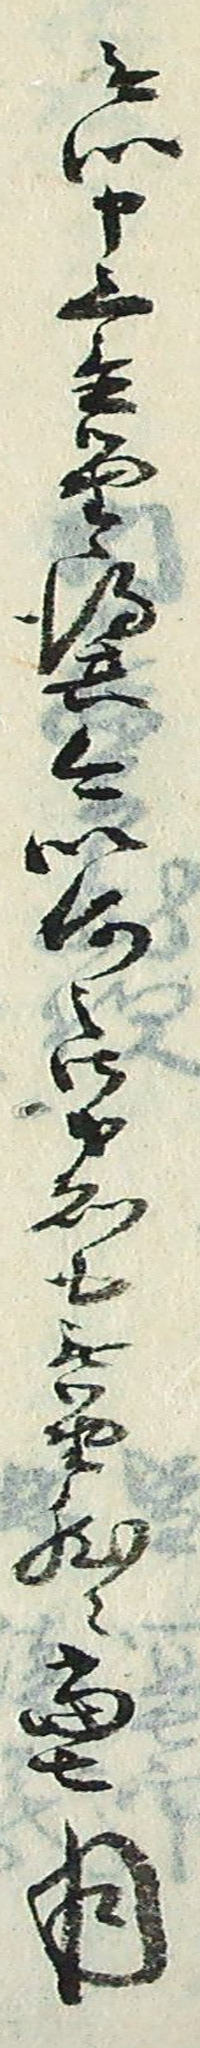を以申上置御坐候得共今以何之御下知も無御坐候然ニ當七月
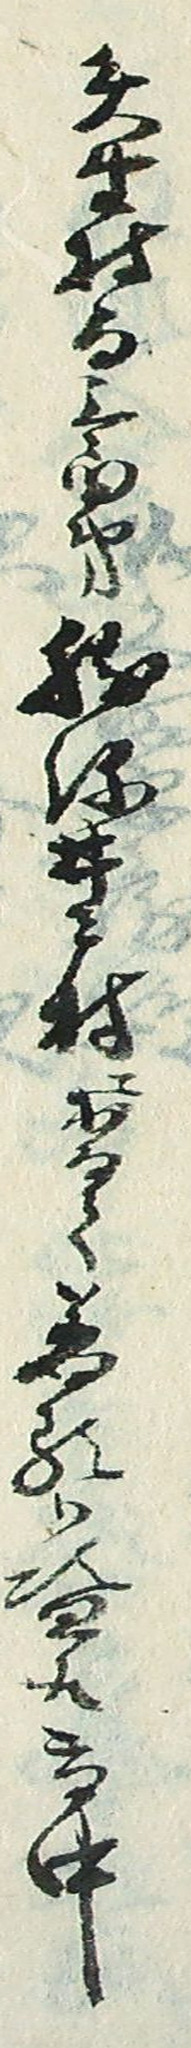矢野村与三郎弟勝弥井戸村ニおゐて着類被盗取市中
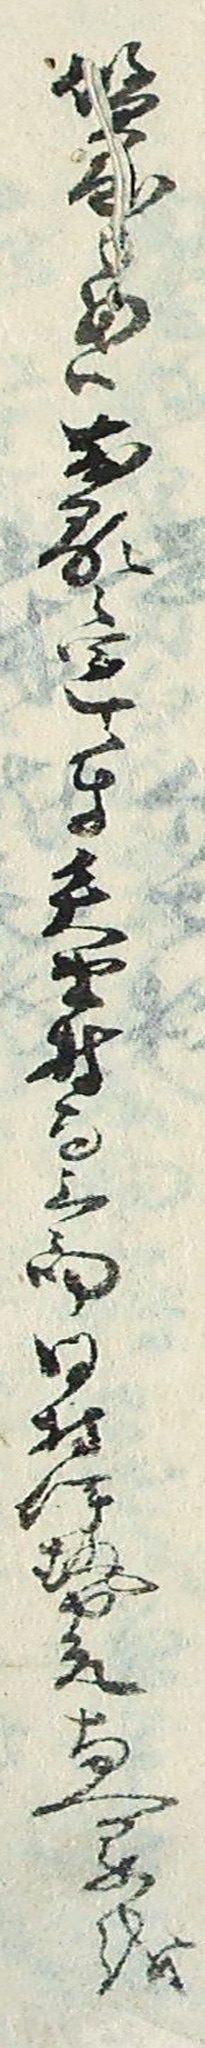質屋之義ハ前顕之運ニ付矢野村与三郎同村伊勢屋両人罷越

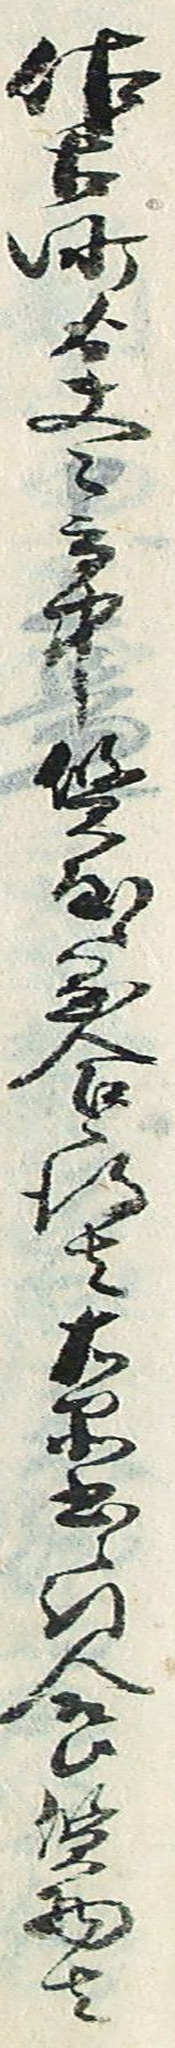佐古町ゟ夫々市中質屋懸合候得者右品書ニ引合候質物者
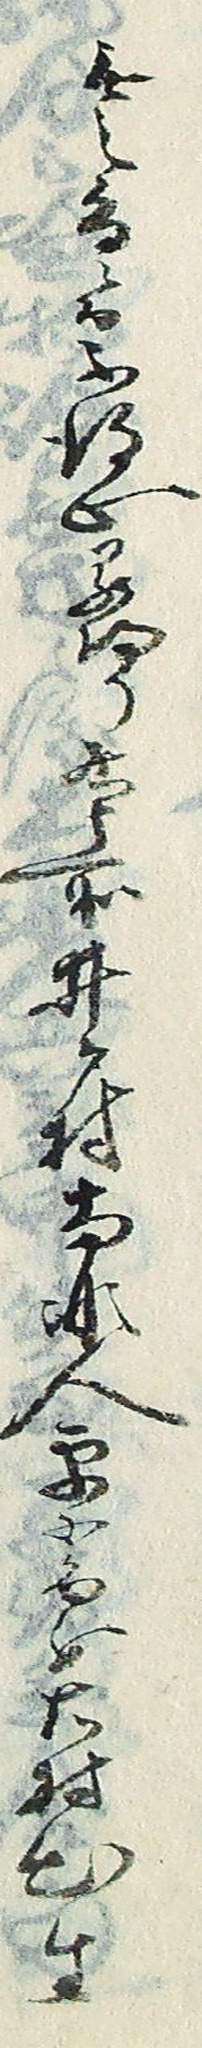無之旨ニ而不得止罷帰り居申所井戸村番非人平五郎義右村出付
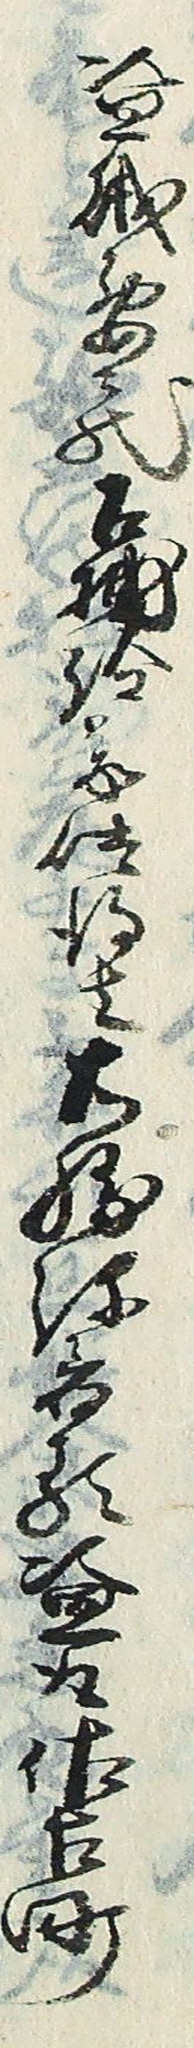盗賊要蔵召捕詮義仕候得者右勝弥着類盗取佐古町
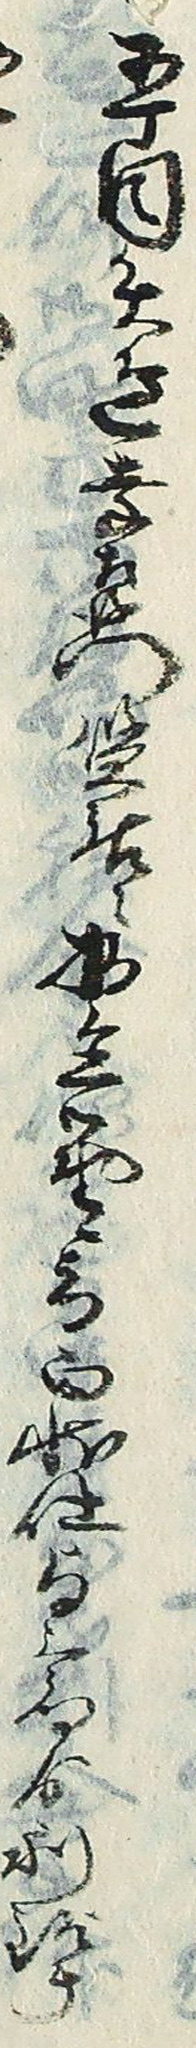五丁目矢辺孝左衛門質居ニ指置御坐候旨白状仕与三郎ゟ利銀ヲ
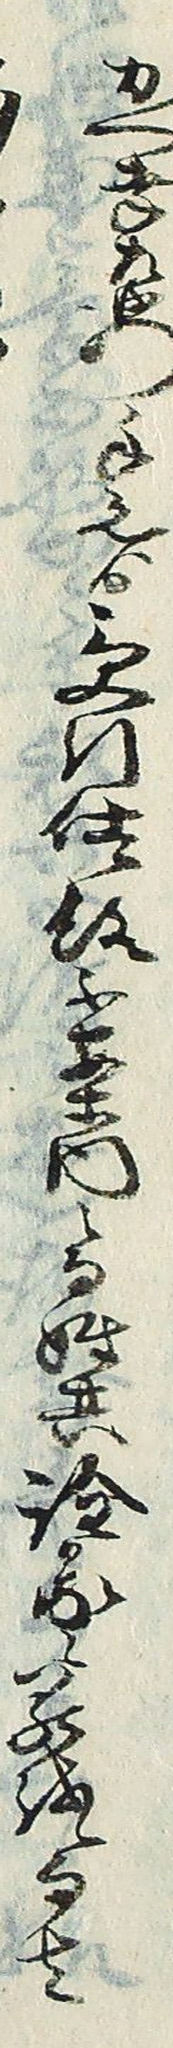加へ孝左衛門手元ゟ受引仕候趣不案内之百姓共詮義ニ罷越候而者
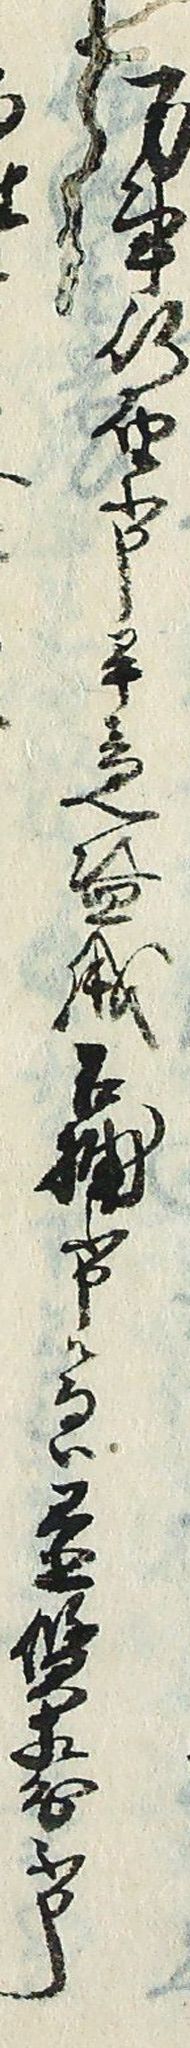万事行届不申畢竟盗賊召捕不申候而ハ置質相分不申
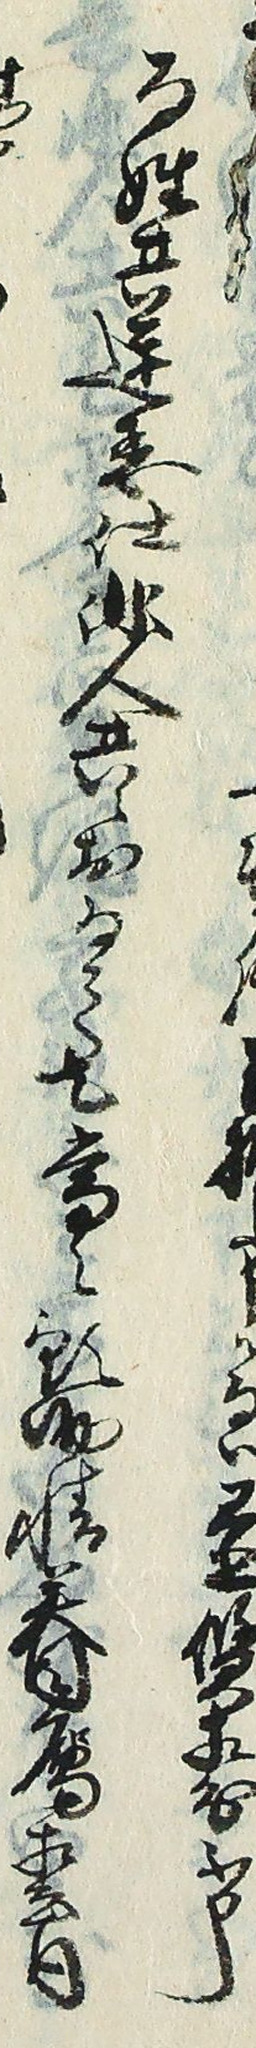百姓共迷惑仕非人共ニおゐて者常々預助情眷属相育
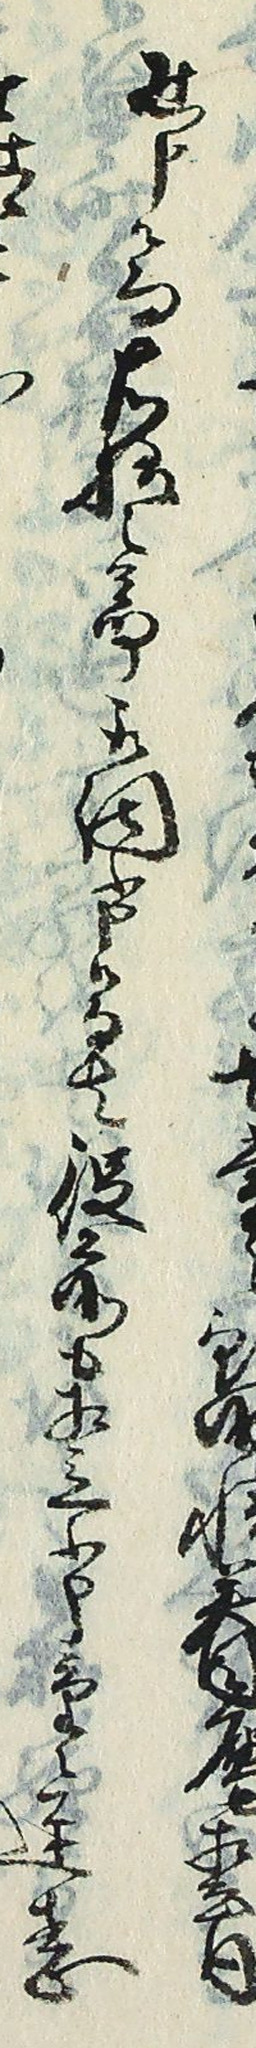居申候而右様之節取調不申候而者役前も相立不申重々迷惑
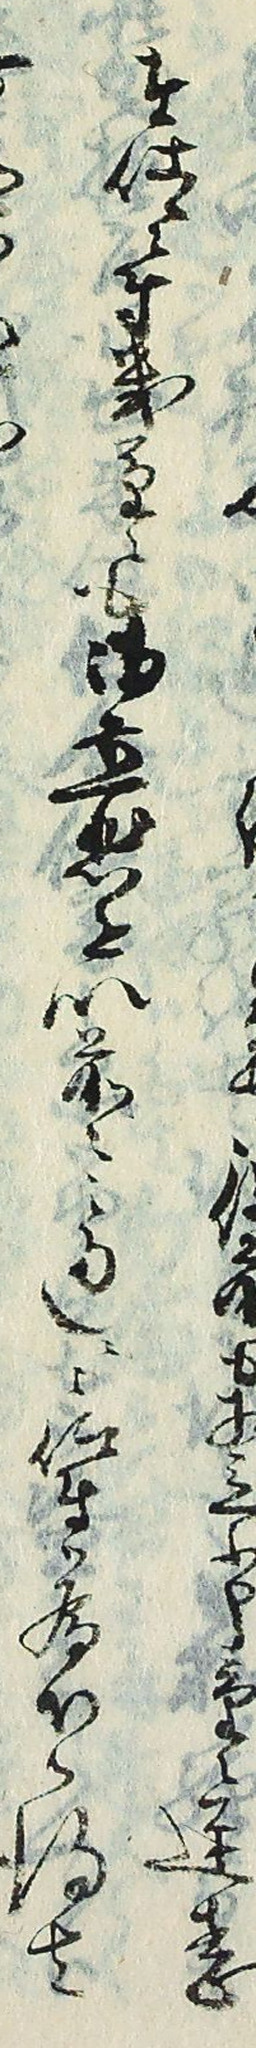奉仕候ニ付幾重ニも御慈悲を以前々之通ニ被仰付被為下候得者
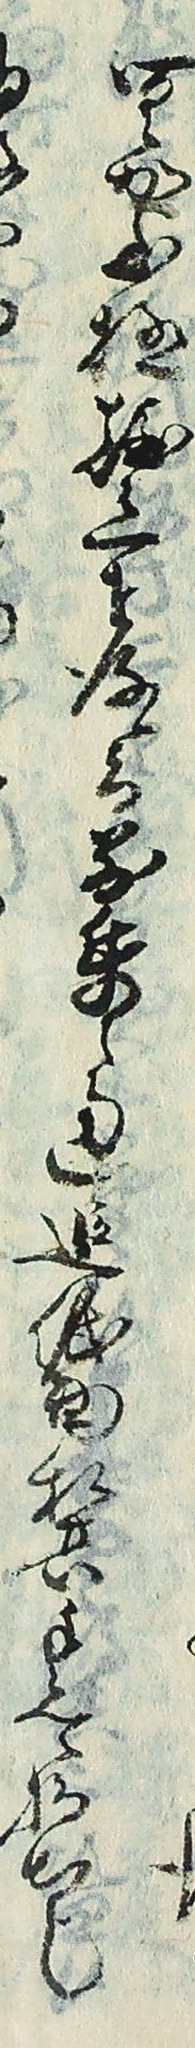冥加至極難有奉存候旨別帋之通追紙面私共手元ニ指出申候
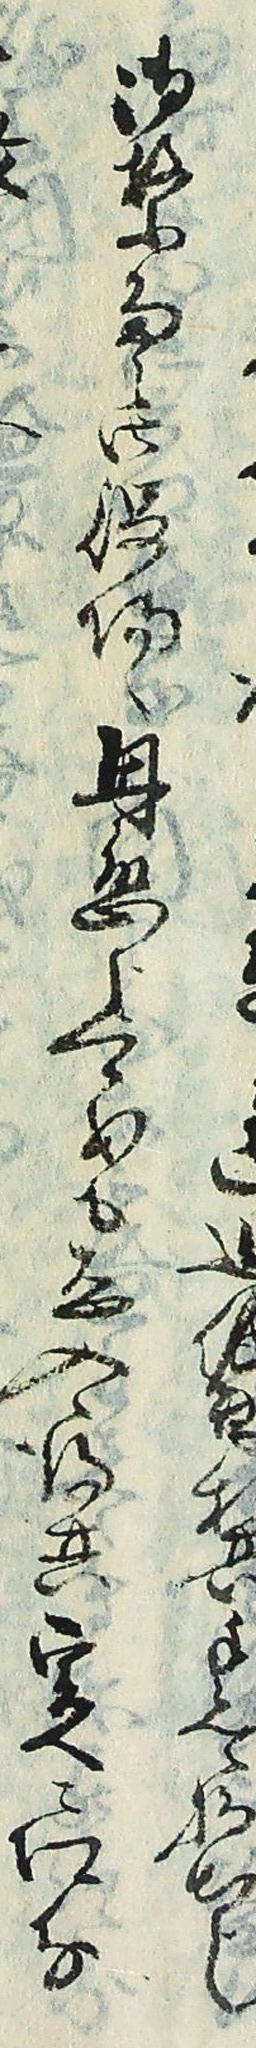御繁多之御役場へ再応申可義も恐入候得共実ニ郷分
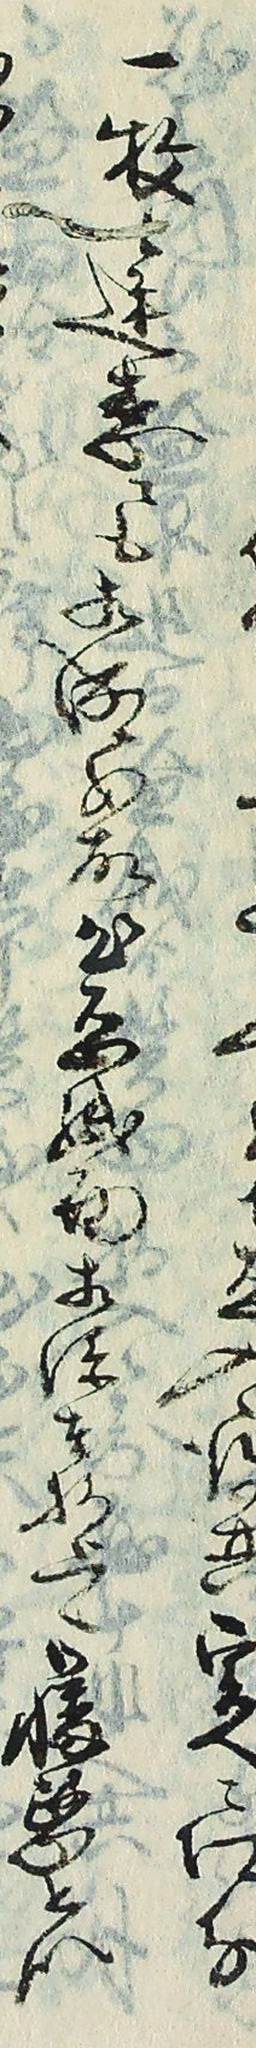一牧ニ迷惑ニも相成候義故乍恐紙面相添奉指上候御憐愍を以
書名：市郷質屋株御取究並御書出御趣法之写
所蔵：鳴門教育大学 Naruto University of Education
